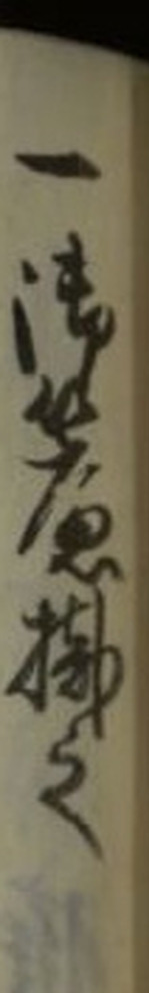一御簾掛之
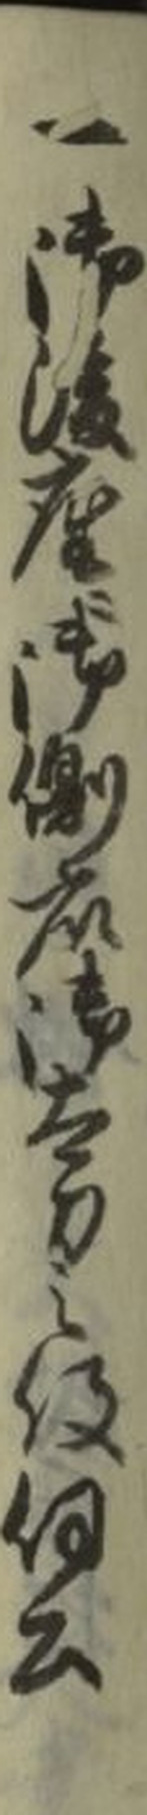一御後座に御側衆御太刀之役伺公
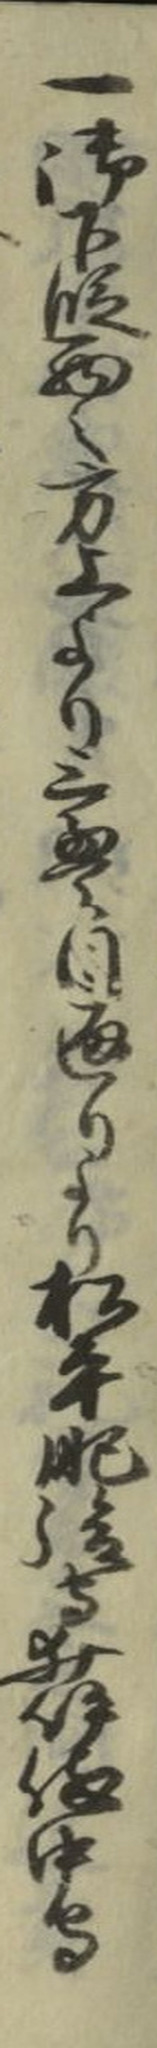一御下段西之方上より三畳目通りより松平肥後守井伊備中守
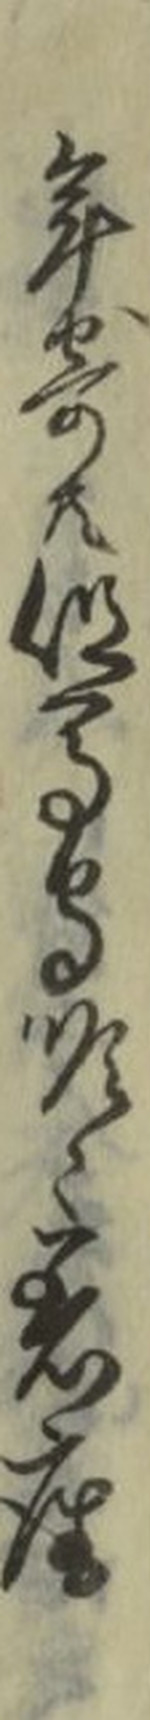年寄共但馬守順々着座
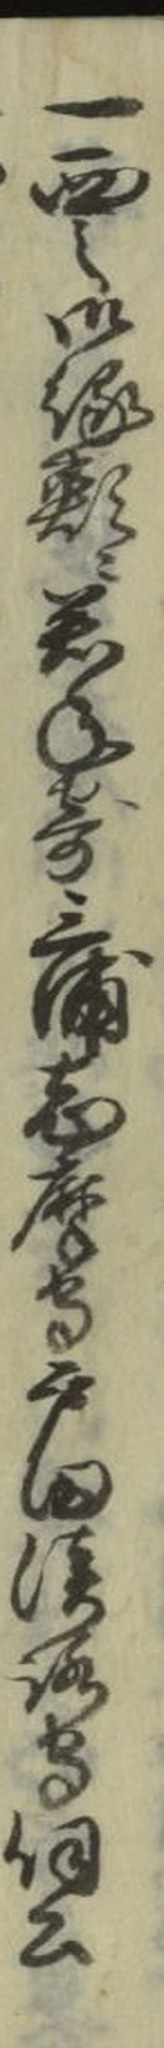一西之御縁頬に若年寄三浦志摩守本田相模守伺公
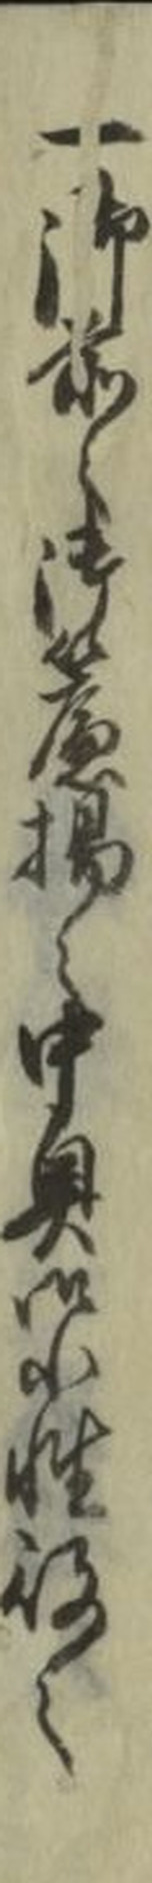一御前之御簾揚之中奥御小姓役之
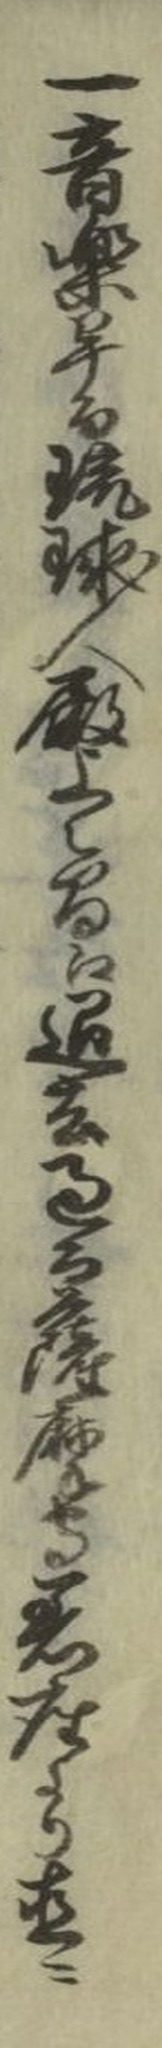一音楽畢而琉球人殿上之間え退去過而薩摩守着座より直に
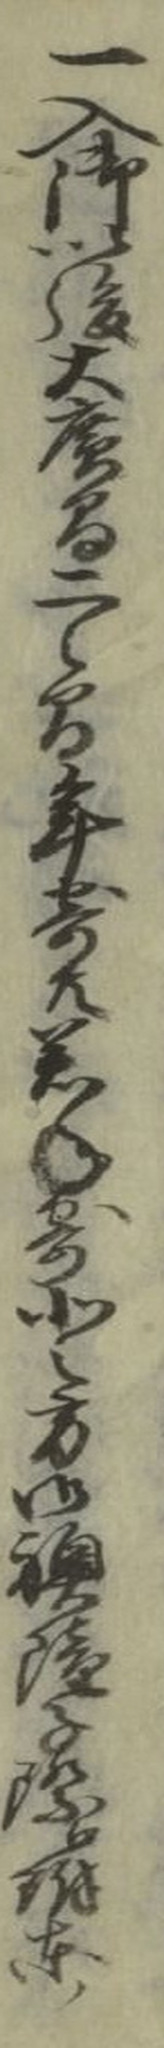一入御以後大広間ニ之間年寄共若年寄北之方御襖障子際え附東の
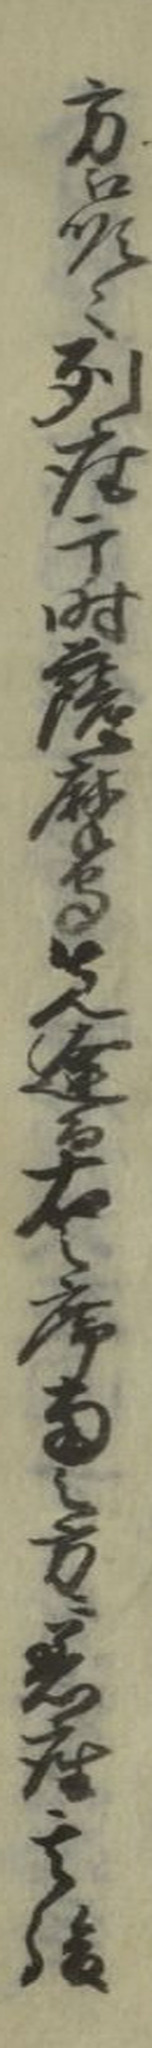方え順々列座于時薩摩守先達而右之席南之方に着座其後

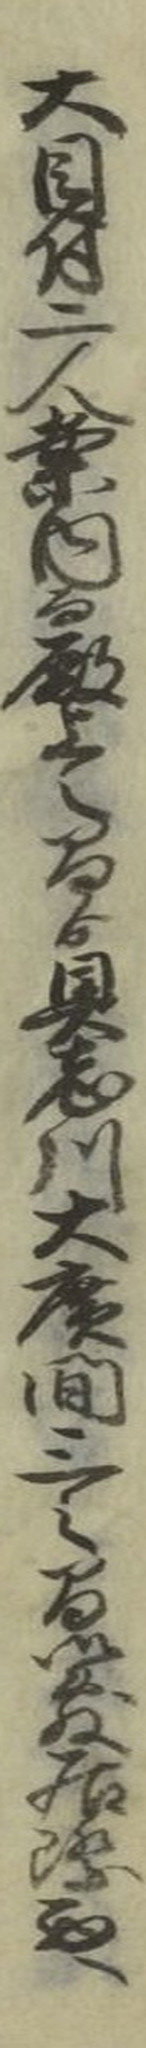大目付二人案内而殿上之間ゟ具志川大広間三之間御敷居際西へ
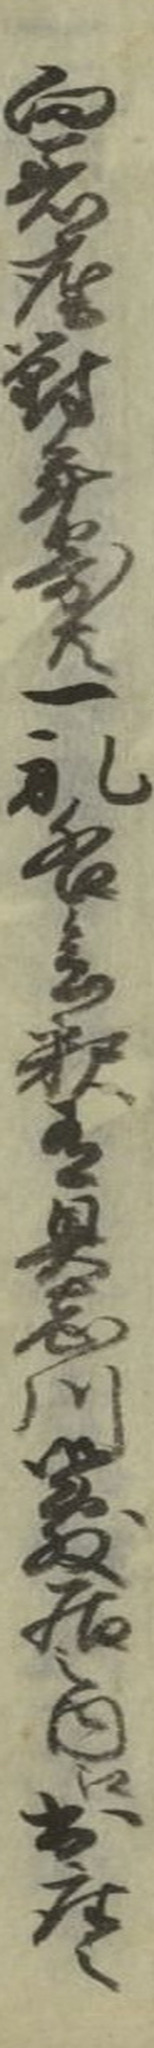向着座対年寄共一礼各会釈有具志川御敷居之内え出座之
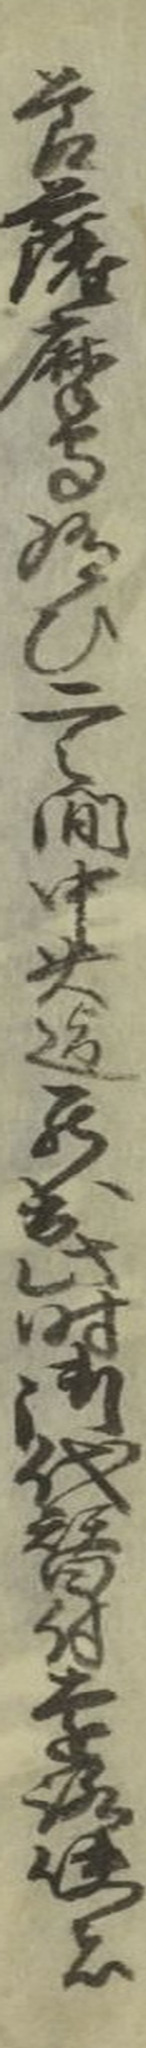節薩摩守給ひニ之間中央ま迠罷出此時御代替付遠路使者
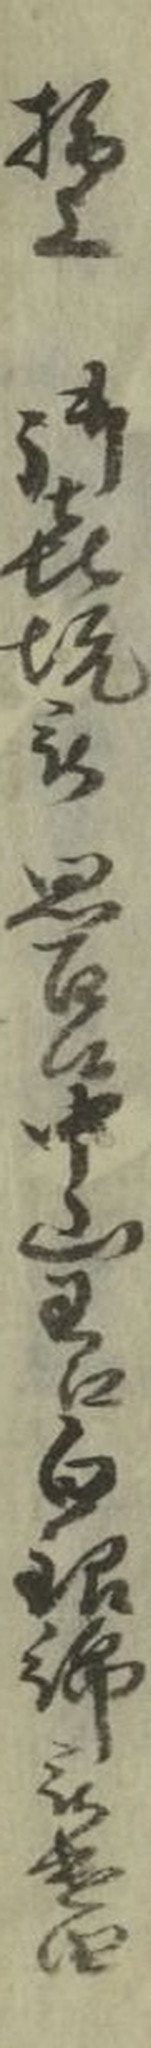指上御喜境被思召候中山王え白銀綿被遣由
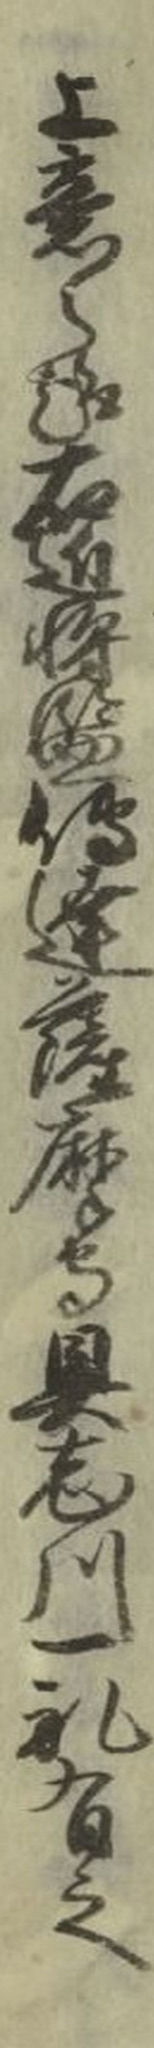上意之趣右近将監でん伝達薩摩守具志川一礼有之
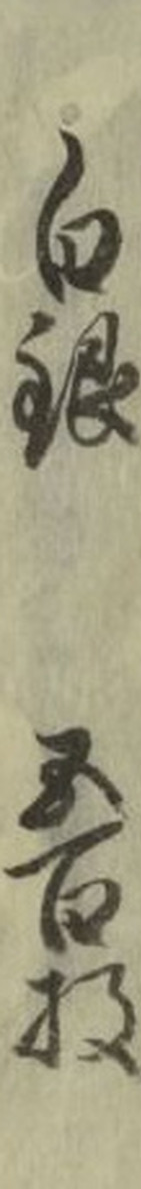白銀五百枚
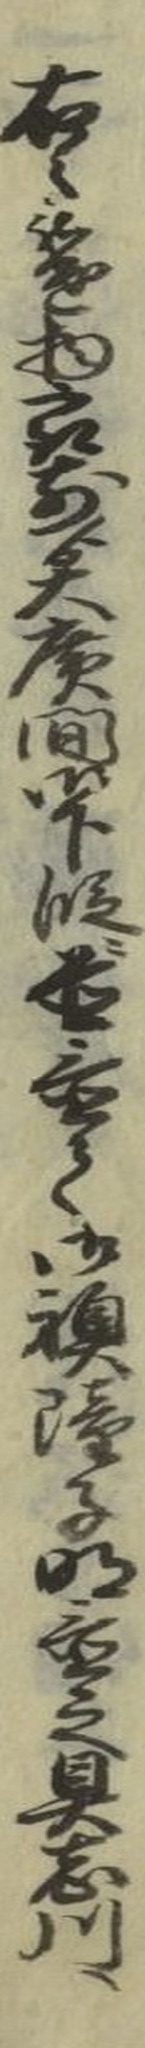右之被遣物罷前ゟ大広間御下段に置て御襖障子明置之具志川へ
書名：琉球人来朝之記
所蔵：University of the Ryukyus Library
